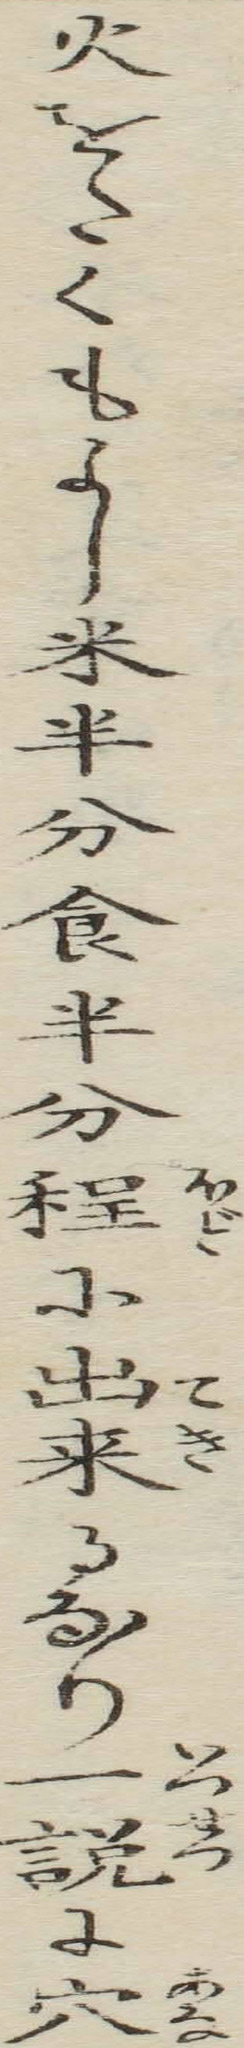火をたくもよし米半分食半分程に出来るなり一説に穴
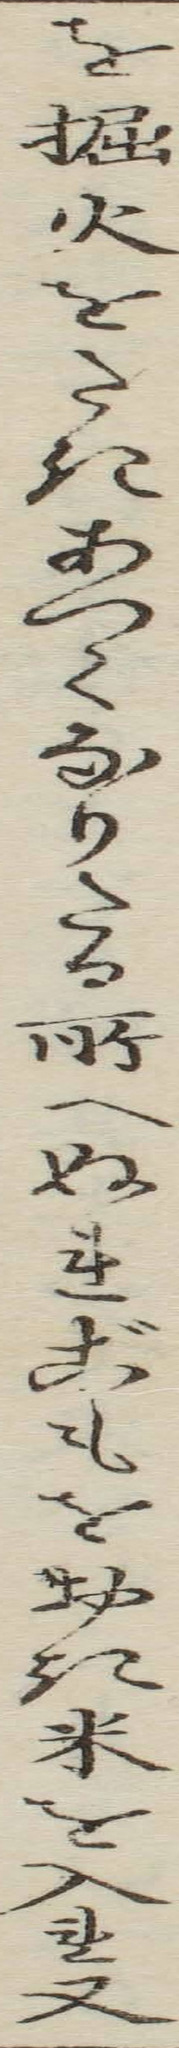を掘火をたきあつくなりたる所へぬれごもをおき米を入れ又

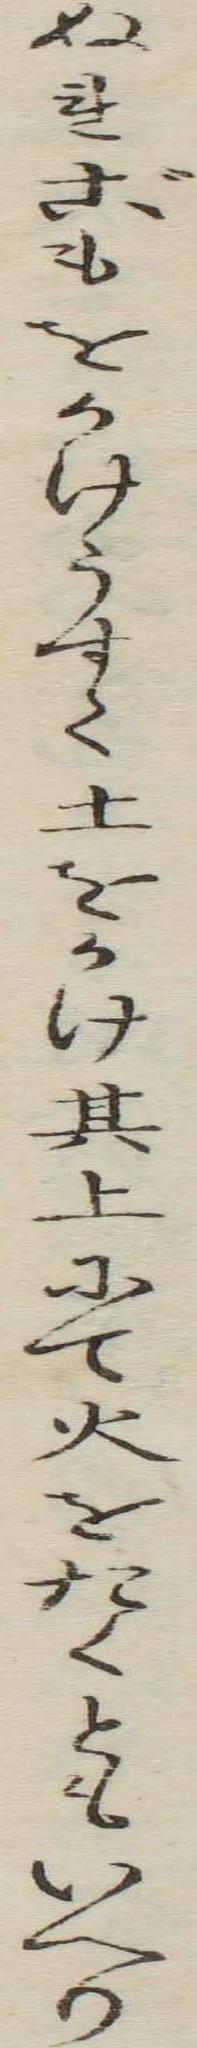ぬれごもをかけうすく土をかけ其上にて火をたくともいへり
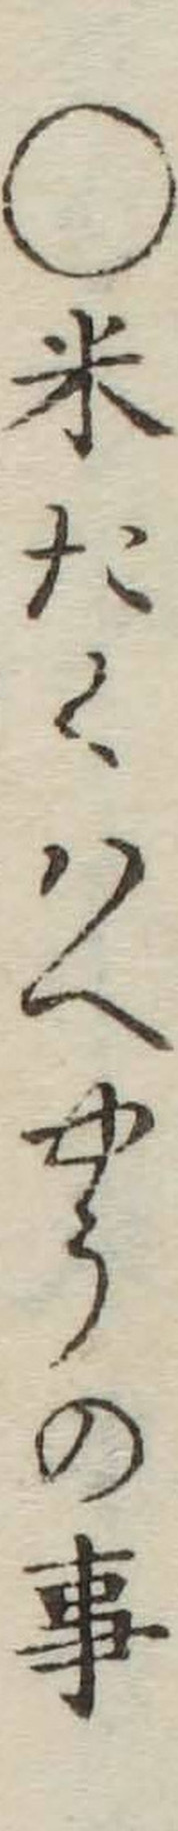○米たくはへやうの事
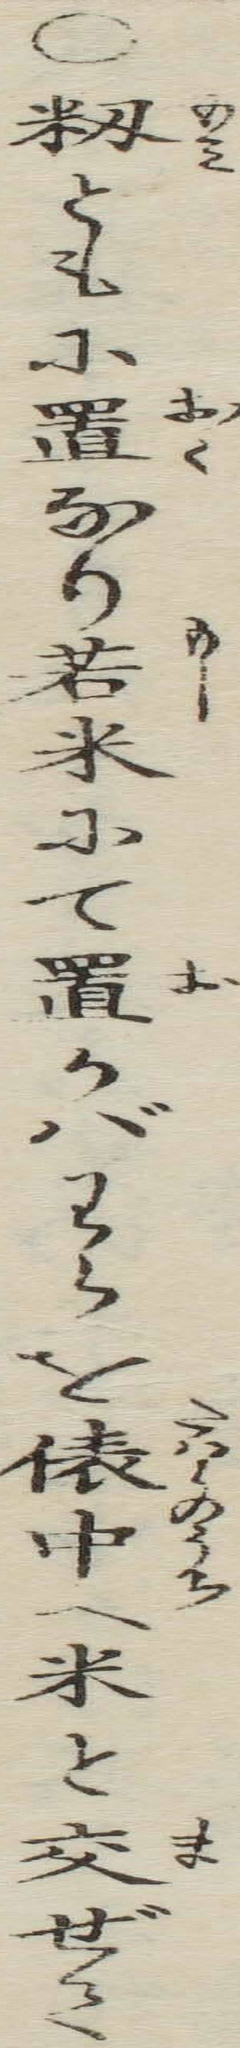○籾ともに置なり若米にて置かばわらを俵中へ米と交ぜて
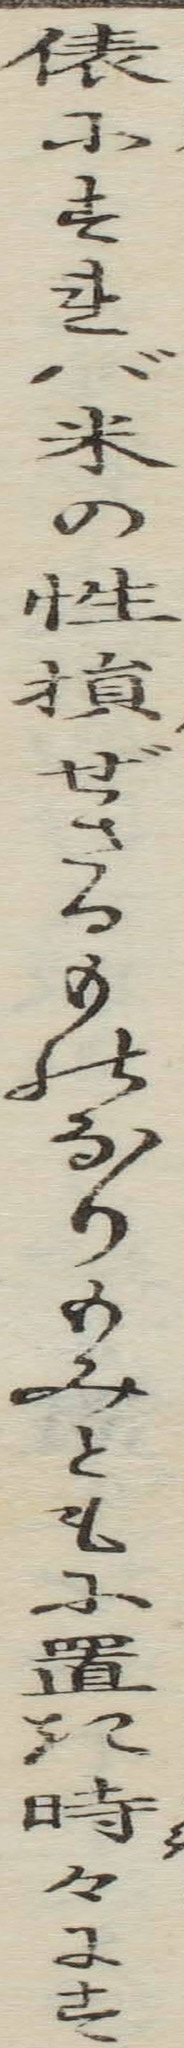俵にすれば米の性損ぜさるものなりもみともに置き時々にす
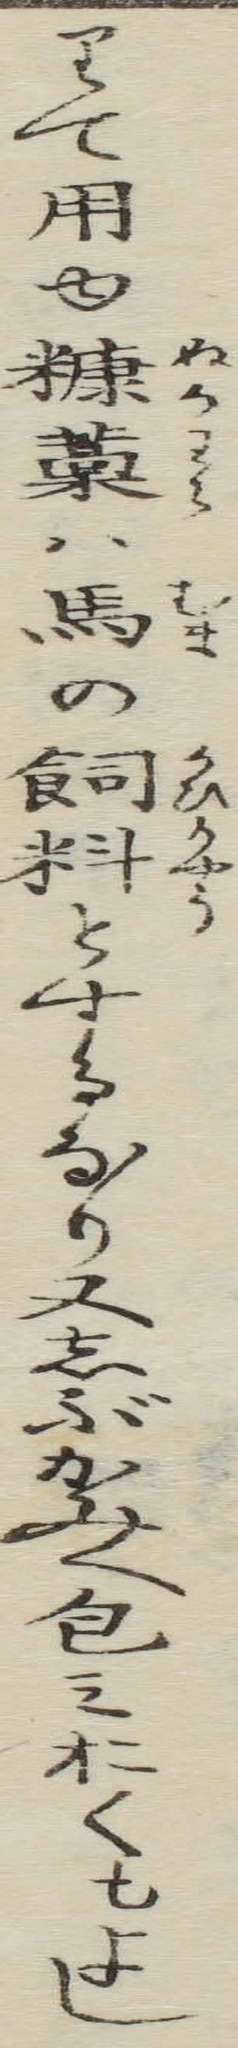りて用ゆ糠藁は馬の飼料とするなり又しぶかみへ包みおくもよし
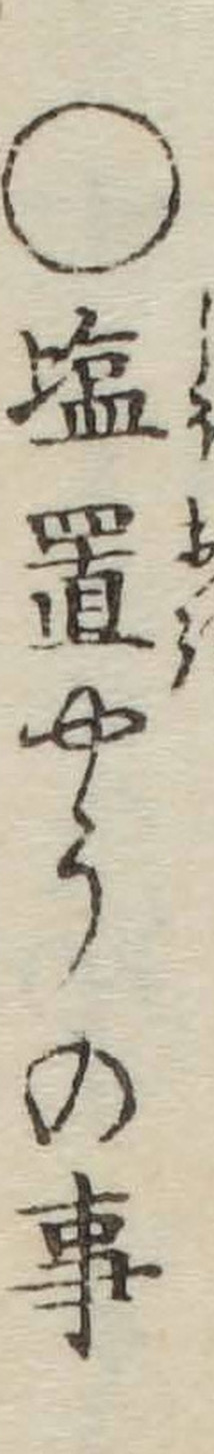○塩置やうの事
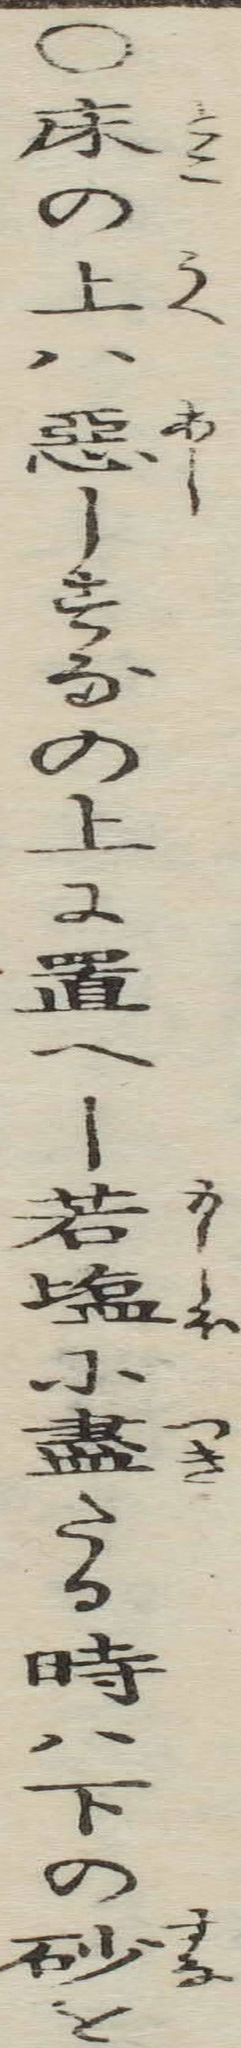○床の上は悪しすなの上に置へし若塩に尽たる時は下の砂を
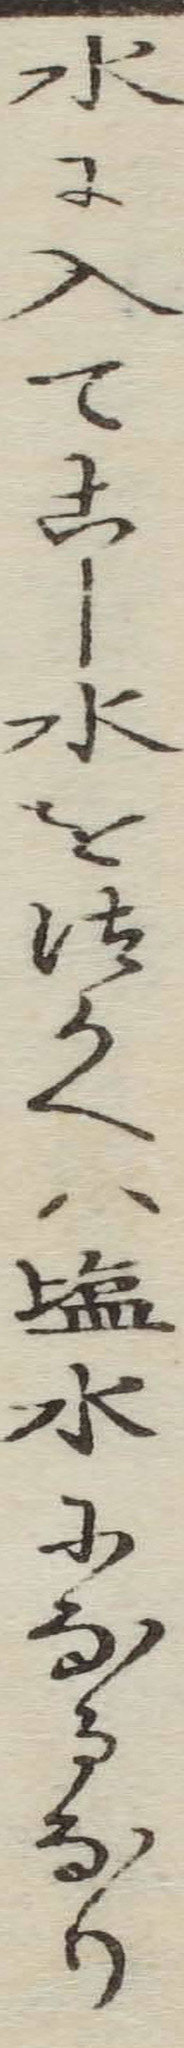水に入てこし水をつかへは塩水になるなり
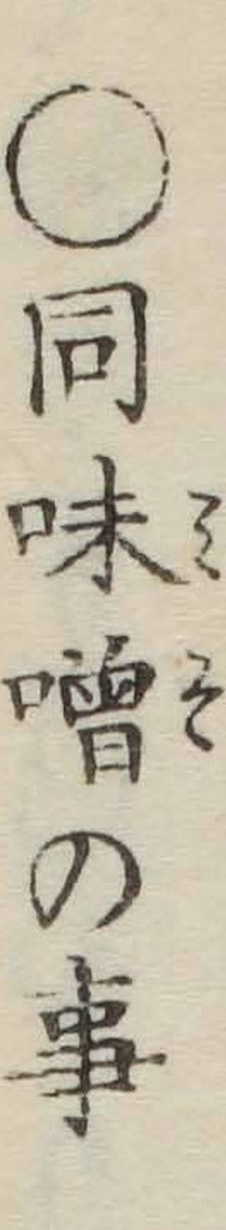○同味噌の事
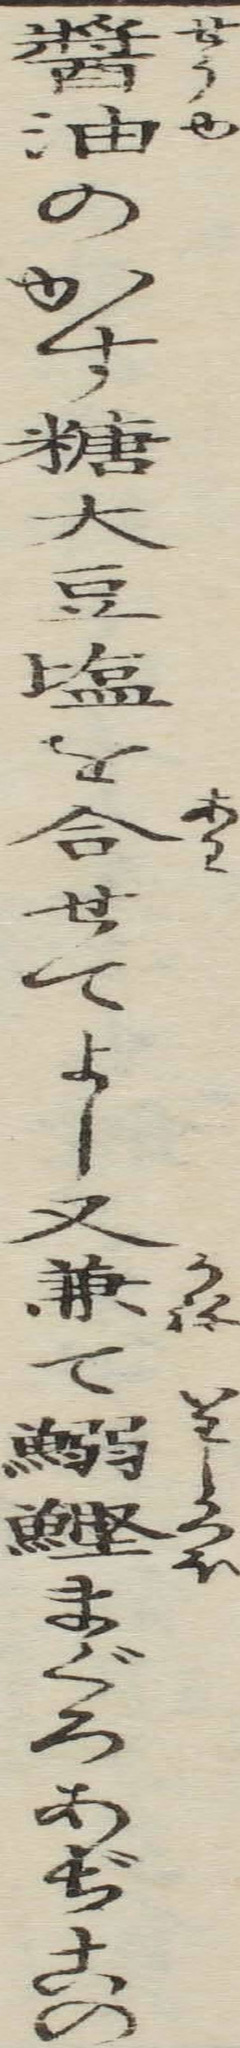醤油のかす糖大豆塩を合せてよし又兼て鰯鰹まぐろあぢこの
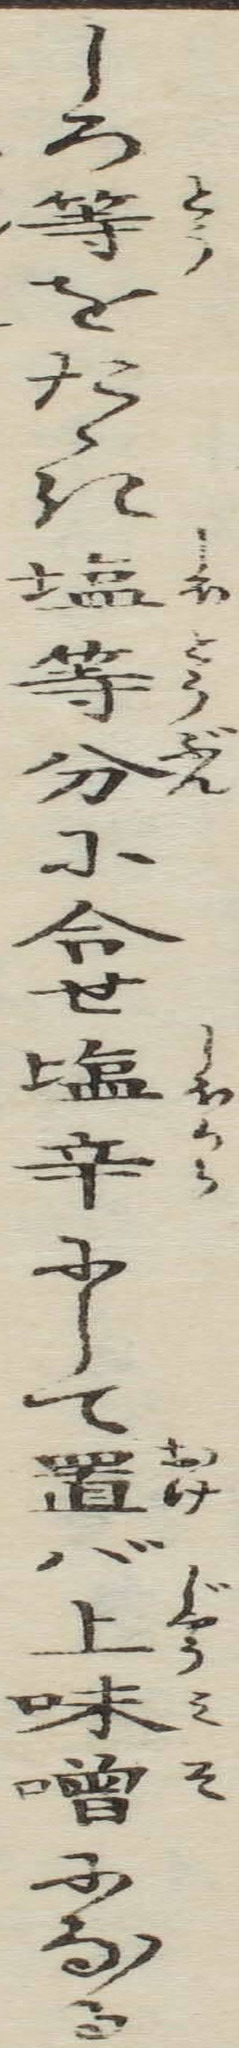しろ等をたゝき塩等分に合せ塩辛にして置ば上味噌になる
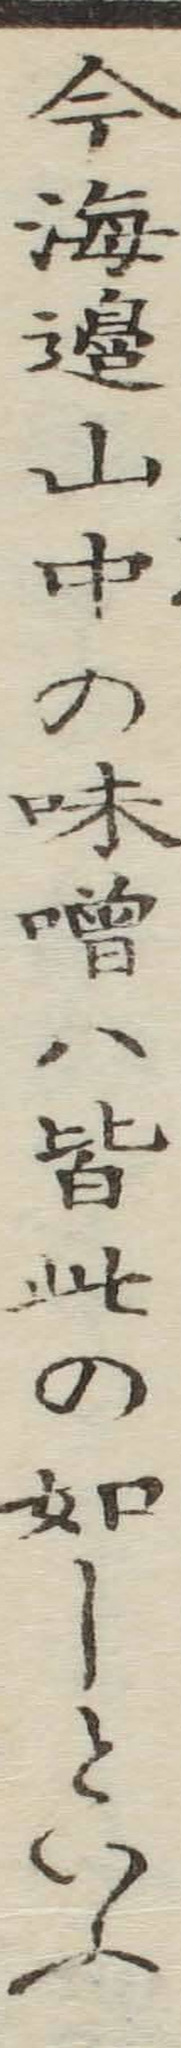今海辺山中の味噌は皆此の如しといふ
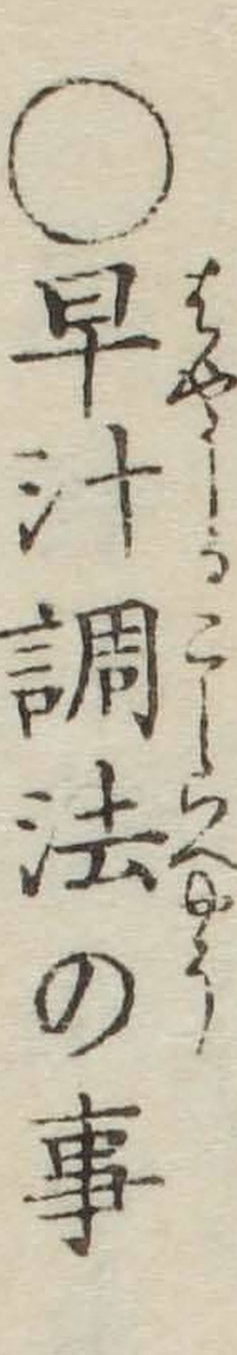○早汁調法の事
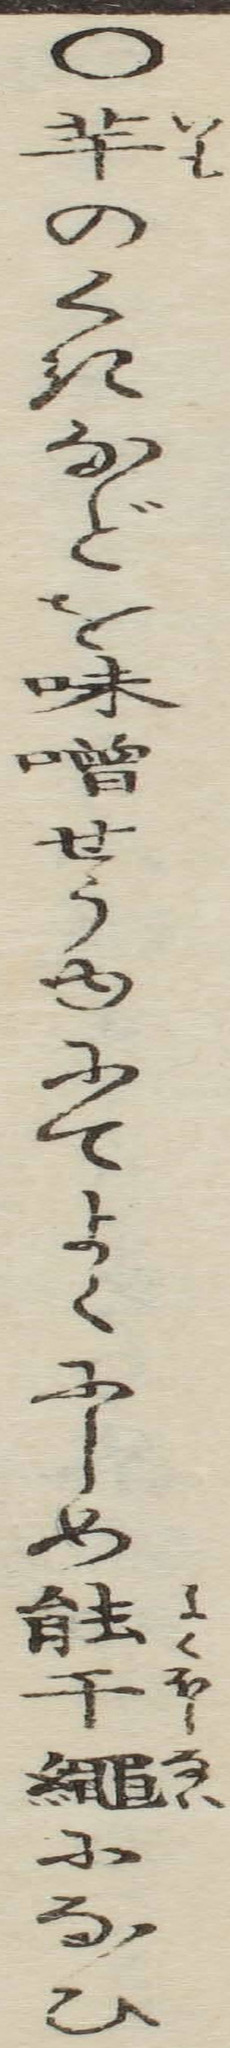○芋のくきなどを味噌せうゆにてよくにしめ能干縄になひ
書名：救荒便覧
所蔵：国文学研究資料館
